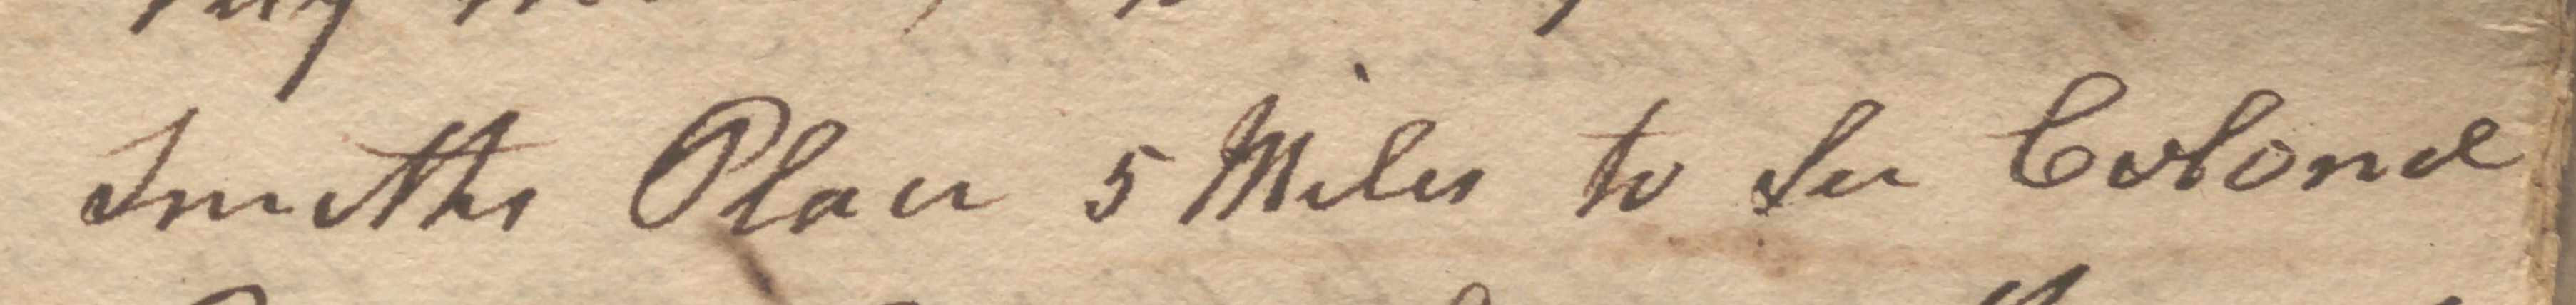Smiths Place 5 Miles to See Colonel
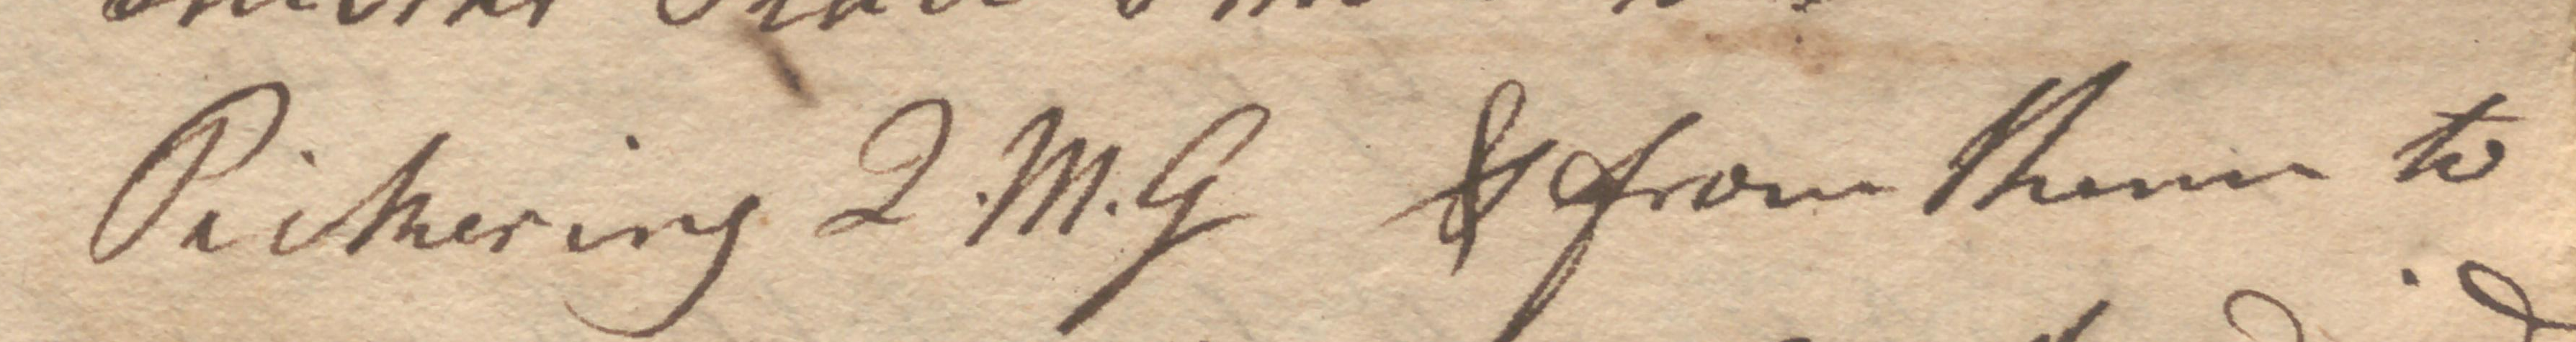Pickering QMG & from thence to
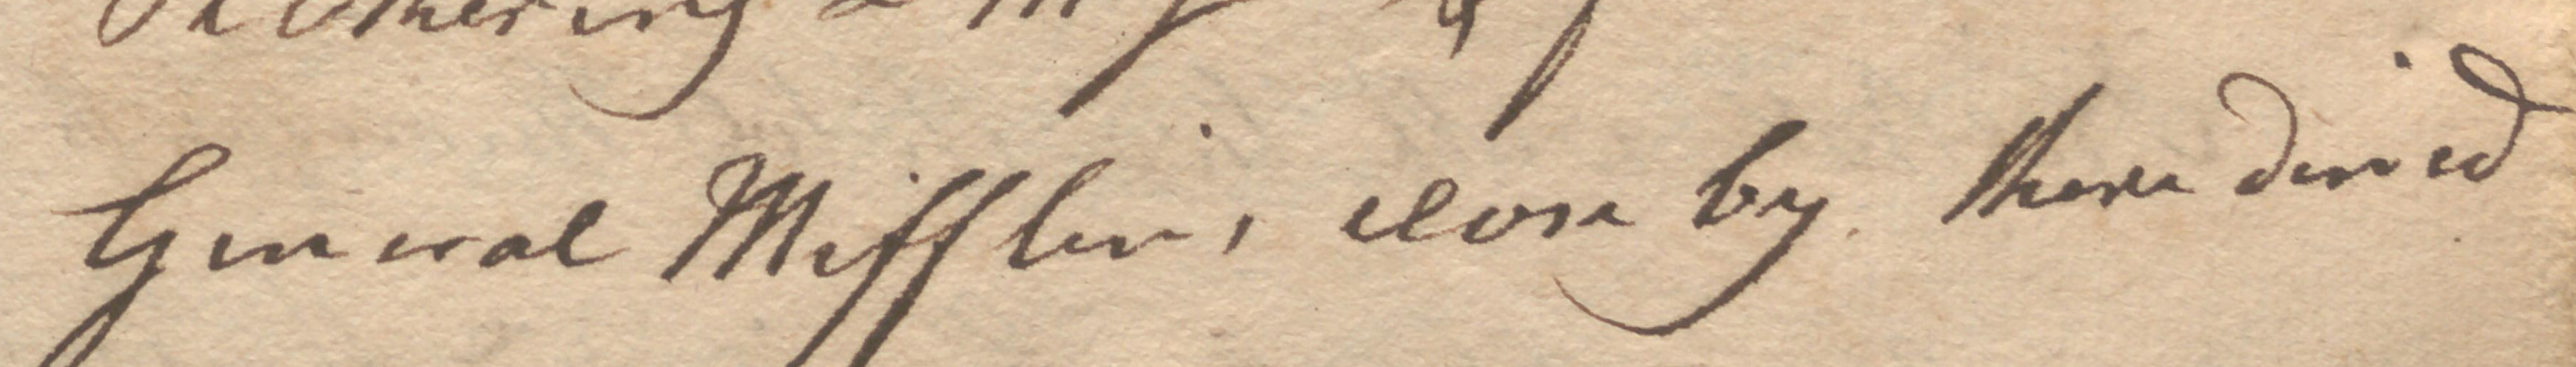General Mifflin, close by there dined
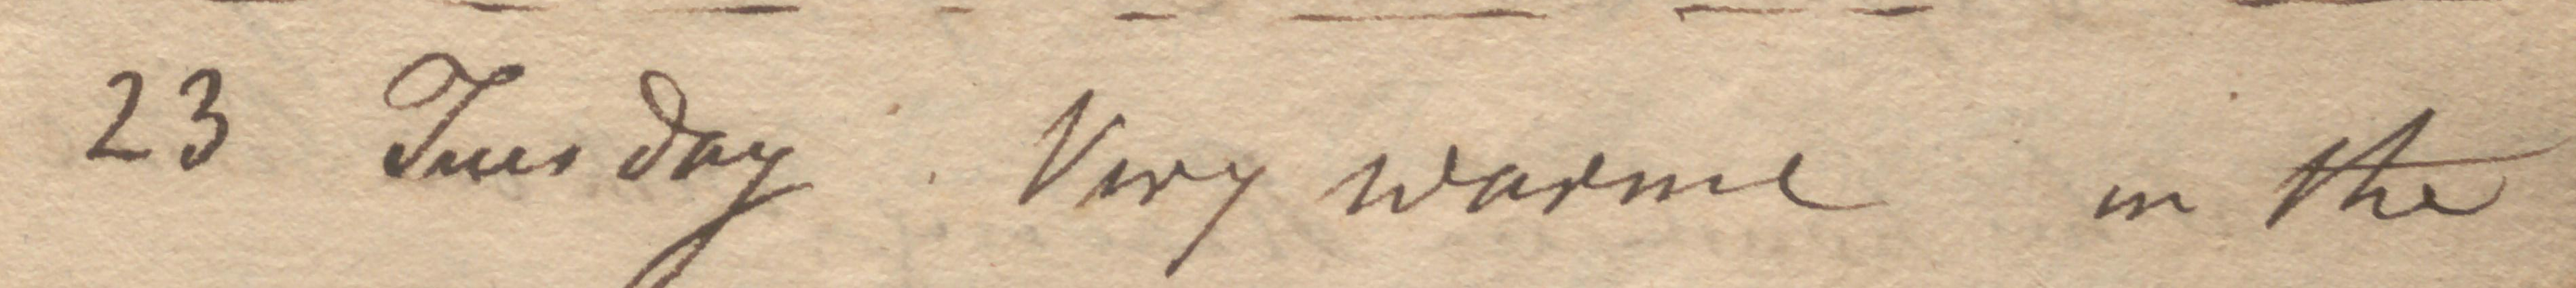23 Tuesday. Very warme in the
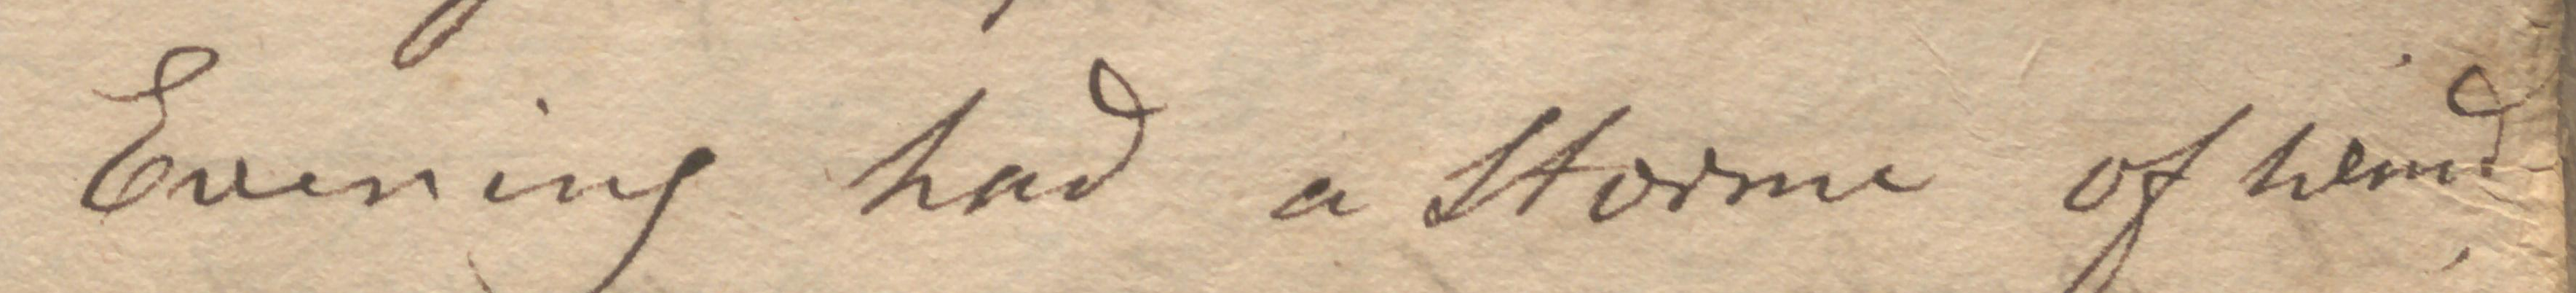Evening had a Storme of wind
